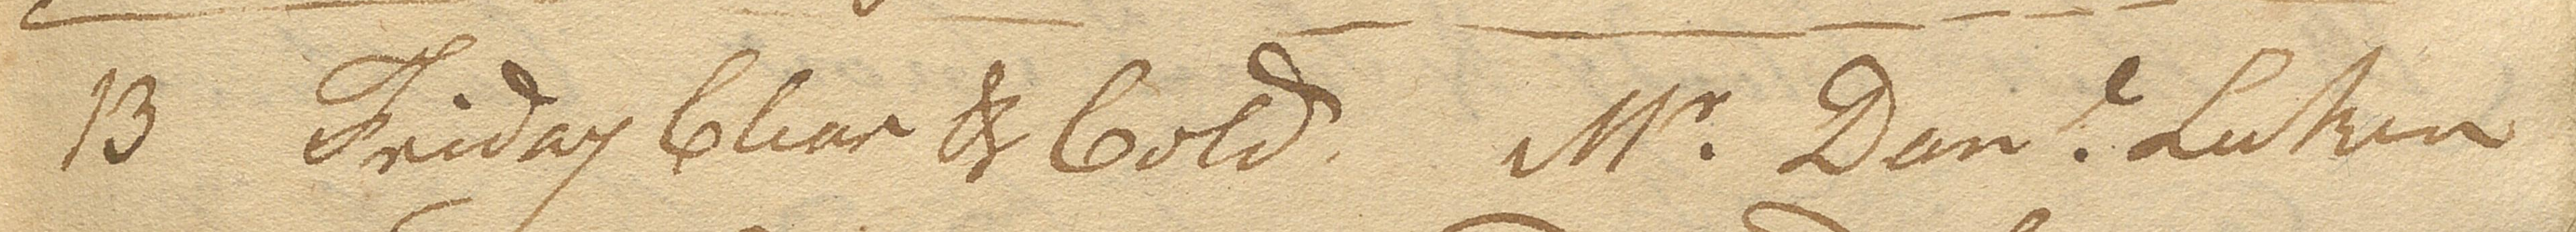13 Friday Clear & Cold. M^r. Dan^l. Luken
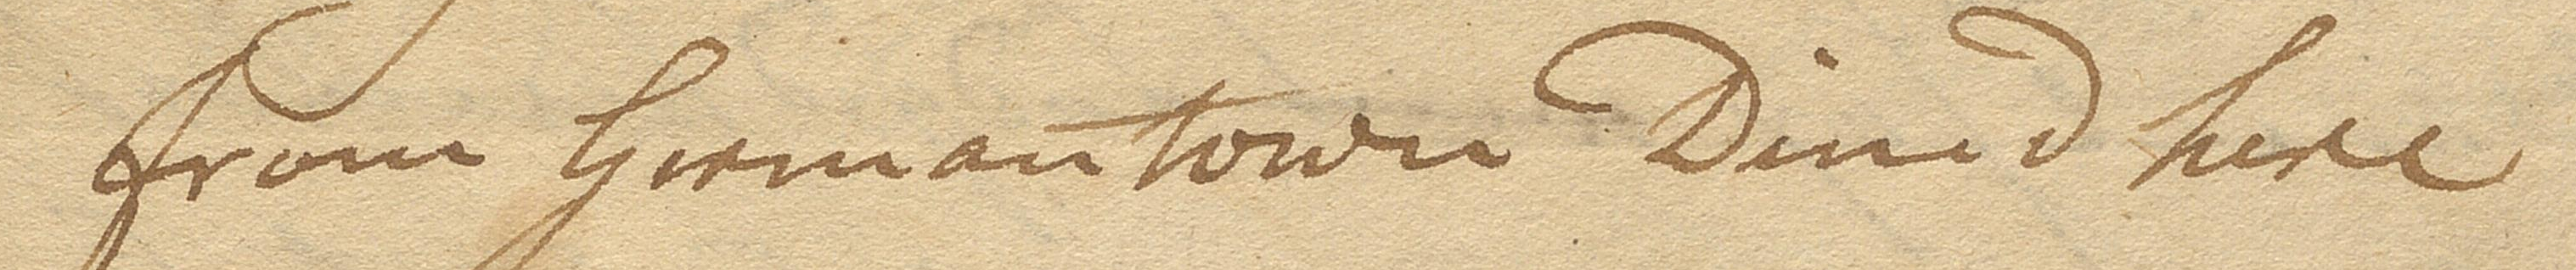from Germantown Dined here
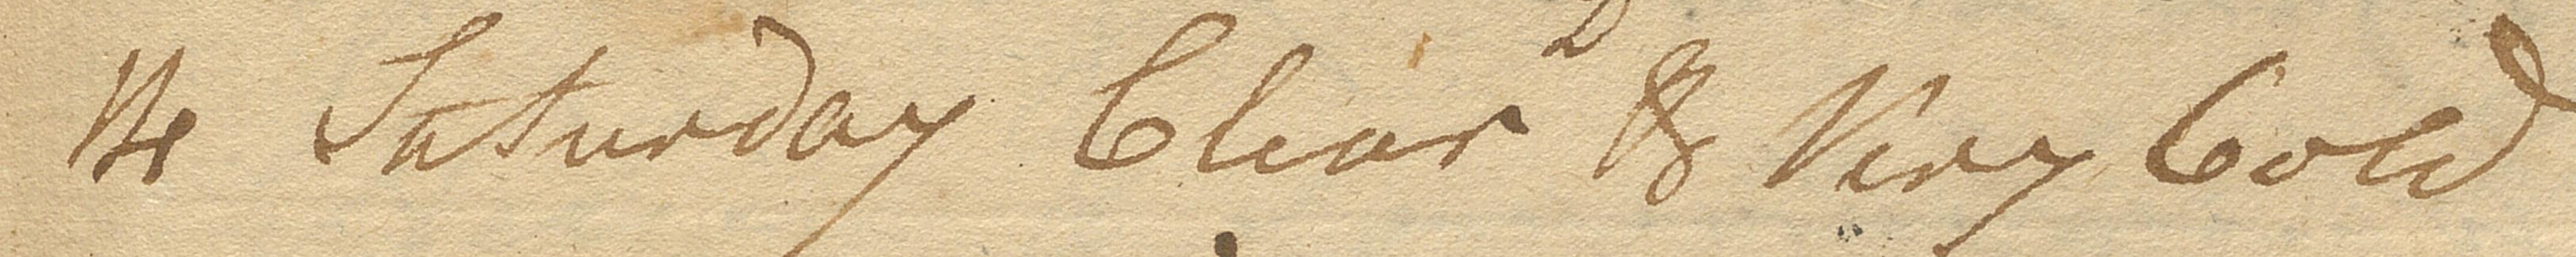14 Saturday Clear & Very Cold
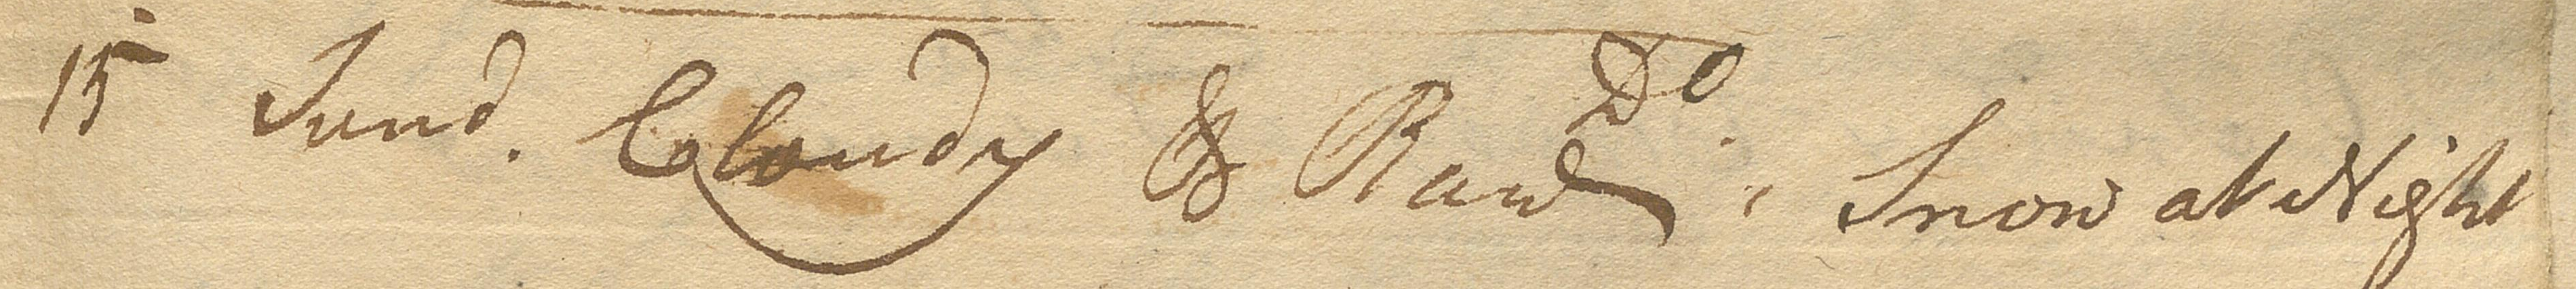15 Sun^d. Cloudy & Raw Snow at Night
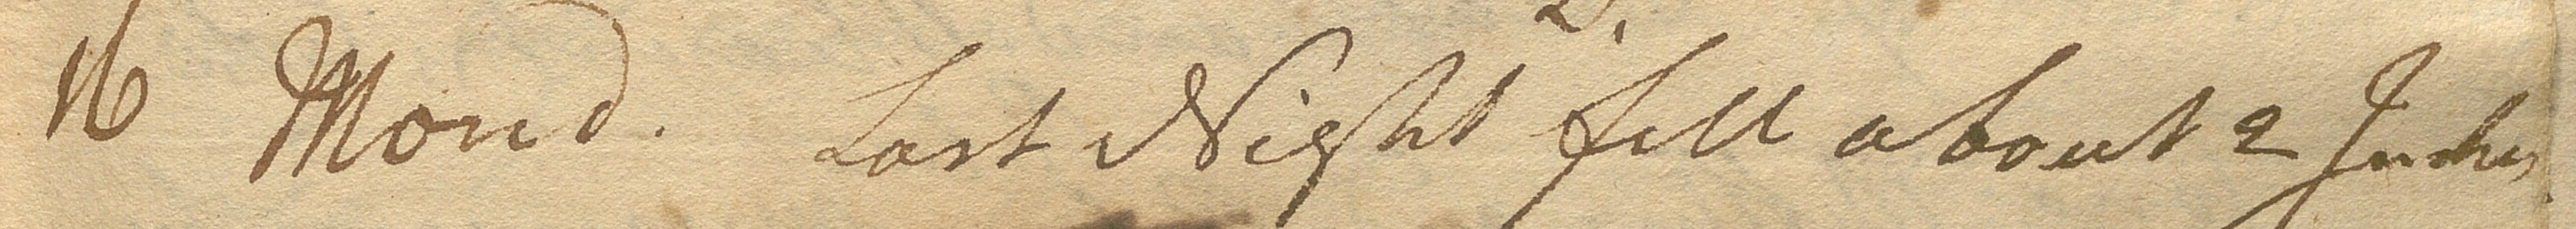16 Mond. Last Night fell about 2 Inches
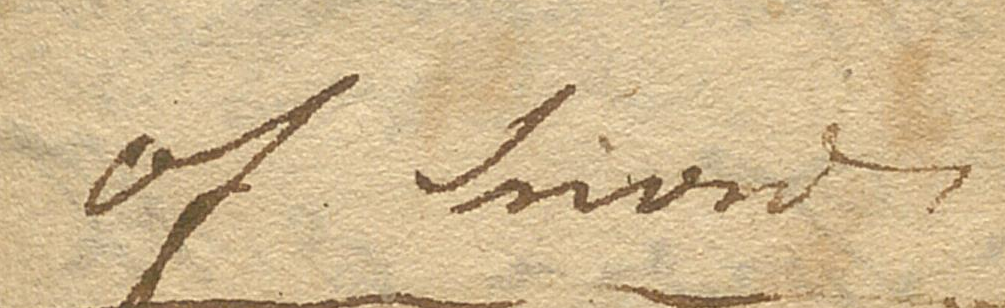of snow
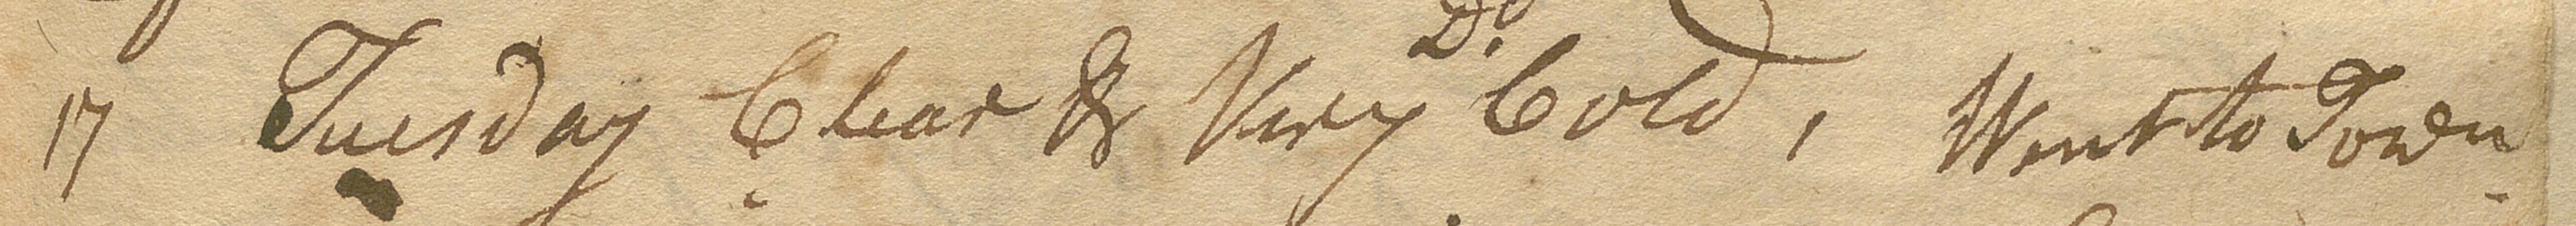17 Tuesday Clear & Very Cold, Went to Town
